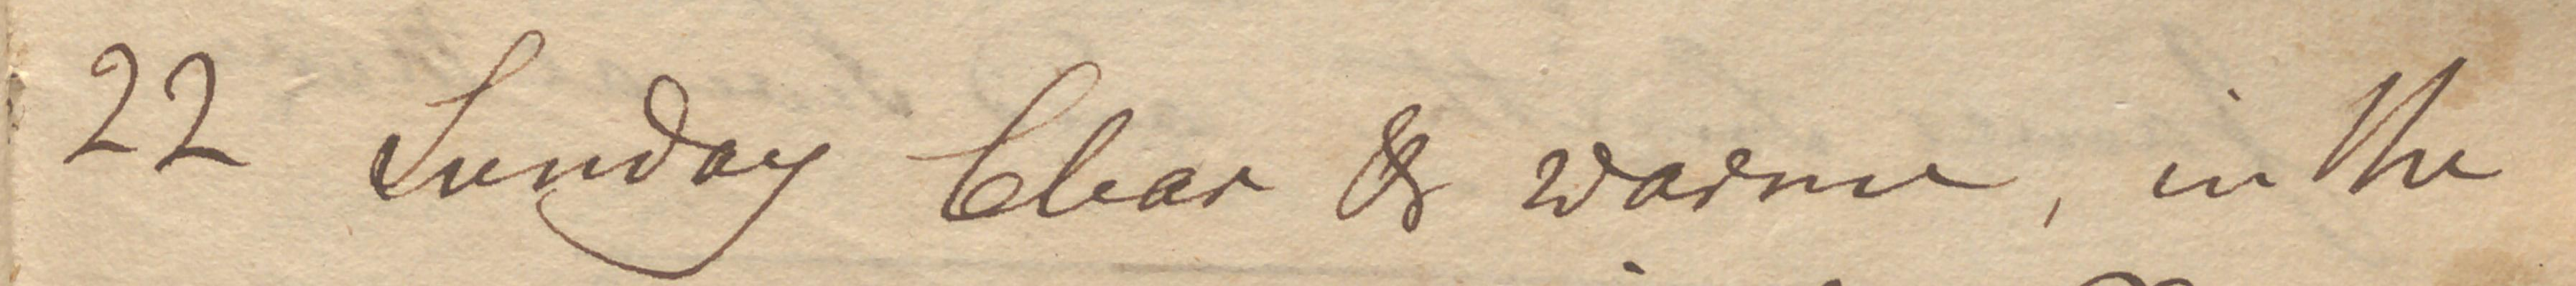22 Sunday Clear & warme, in the
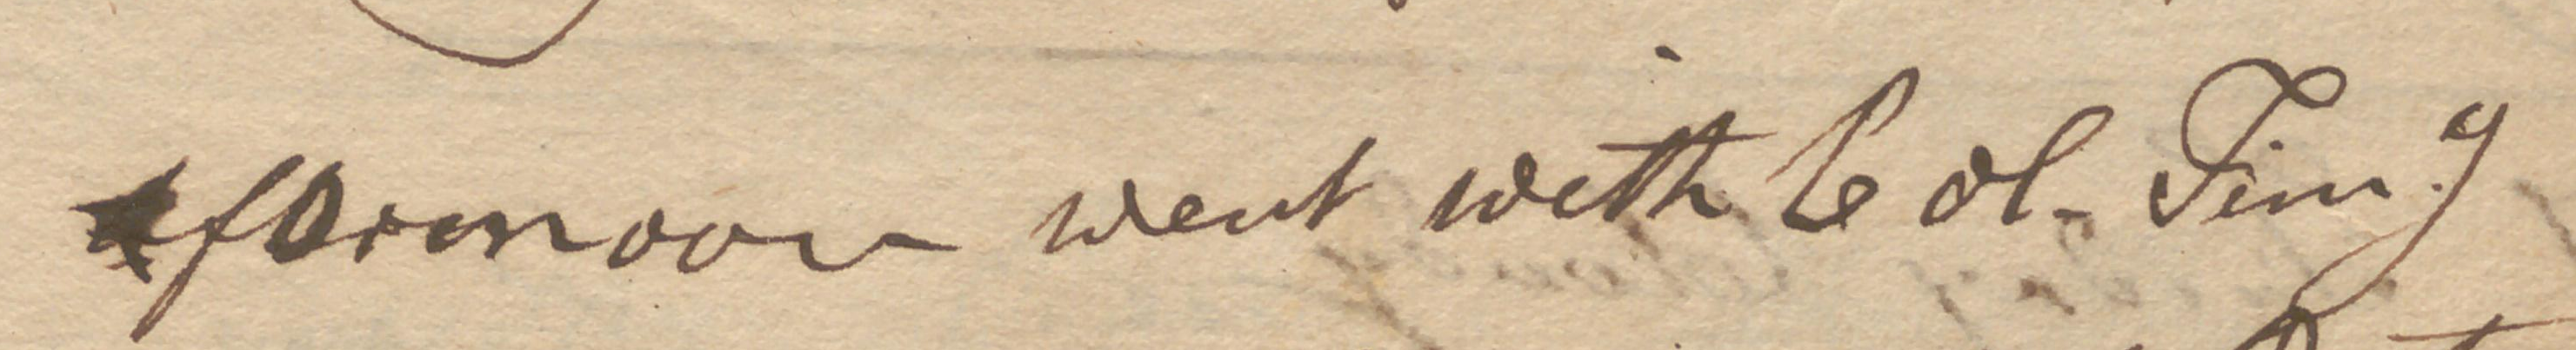afermoon went with C ol. Tim^y.
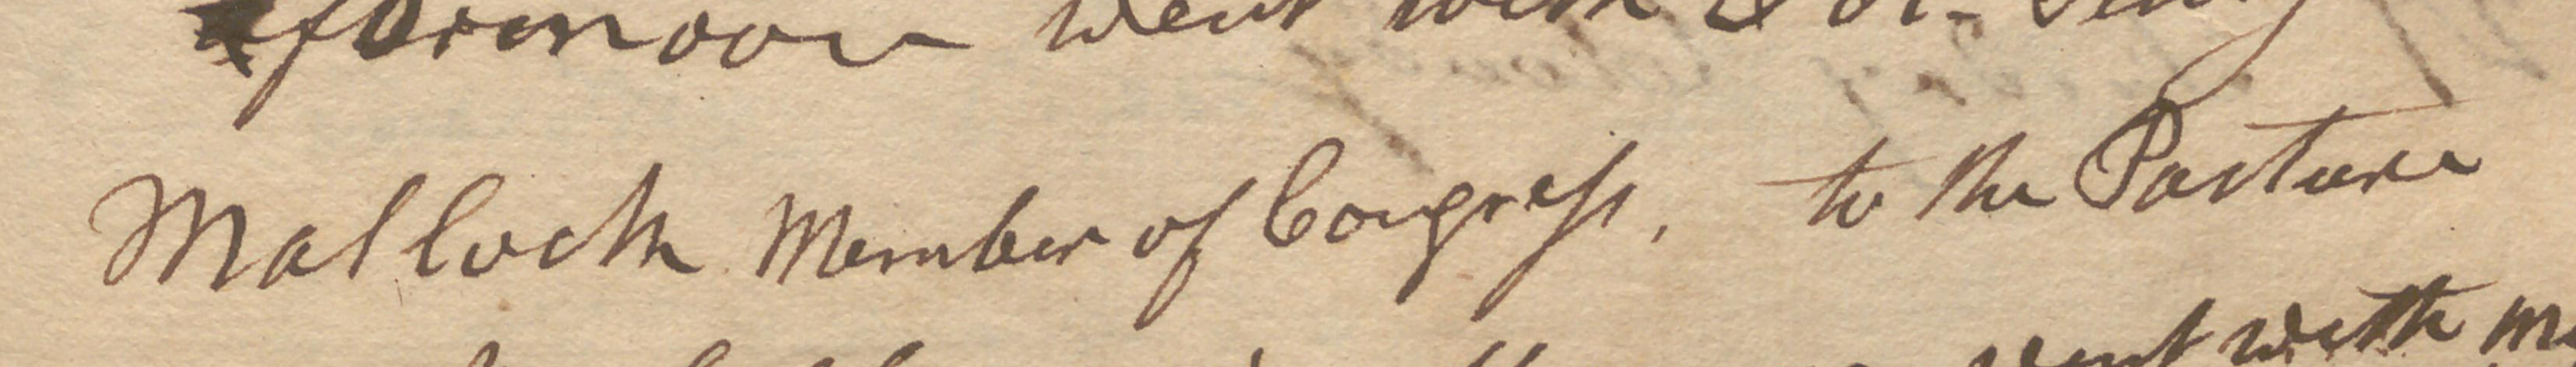Matlock Member of Corgress, to the Pasture
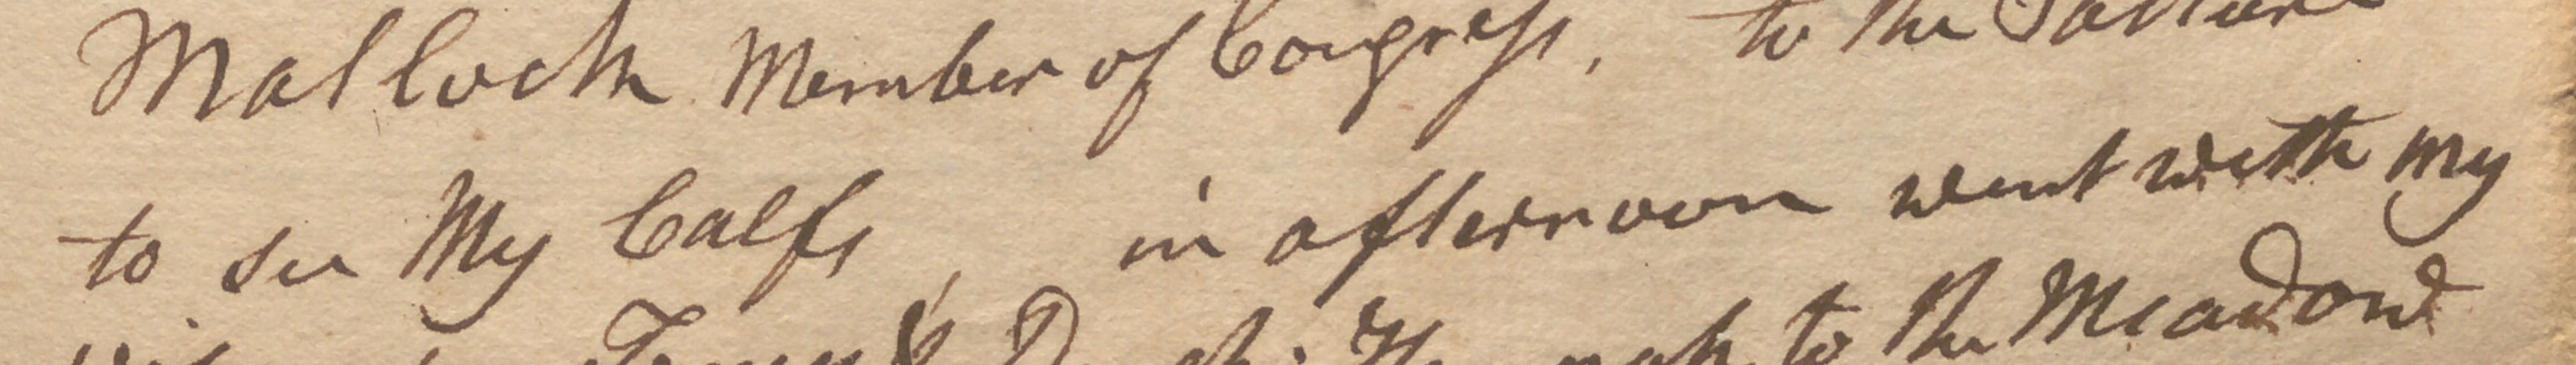to see My Calfs, in afternoon went with my
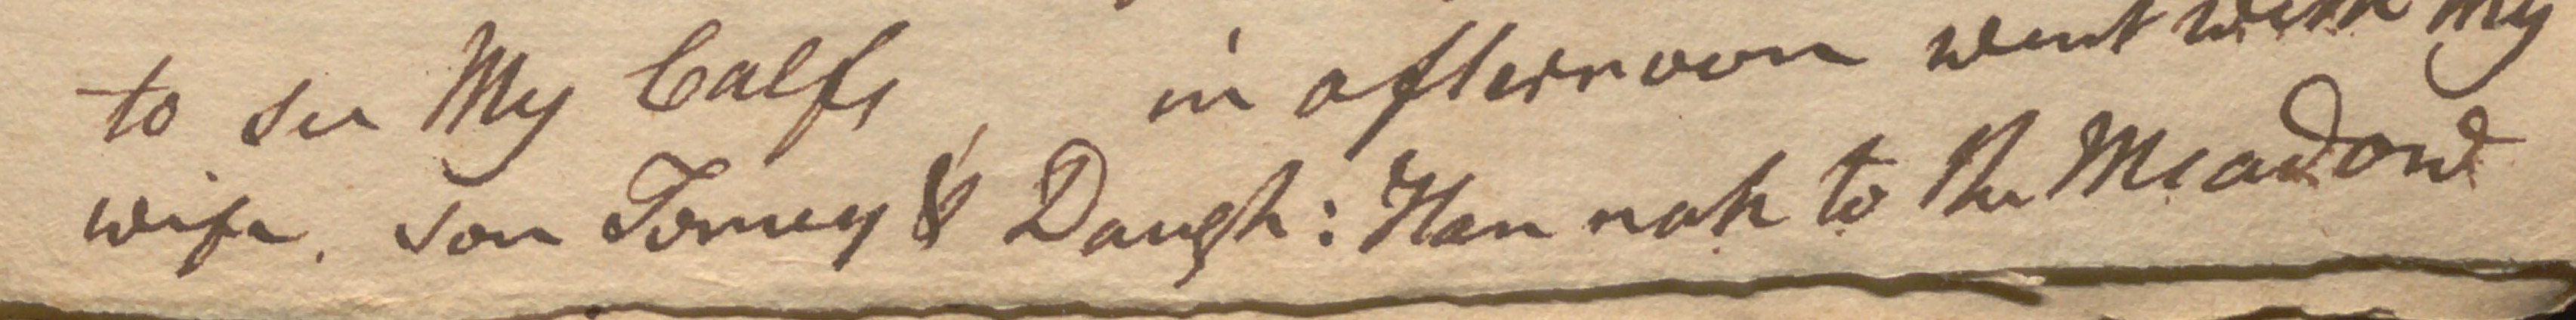wife, son Tomey & Daugh. Hannah to the Meadow
